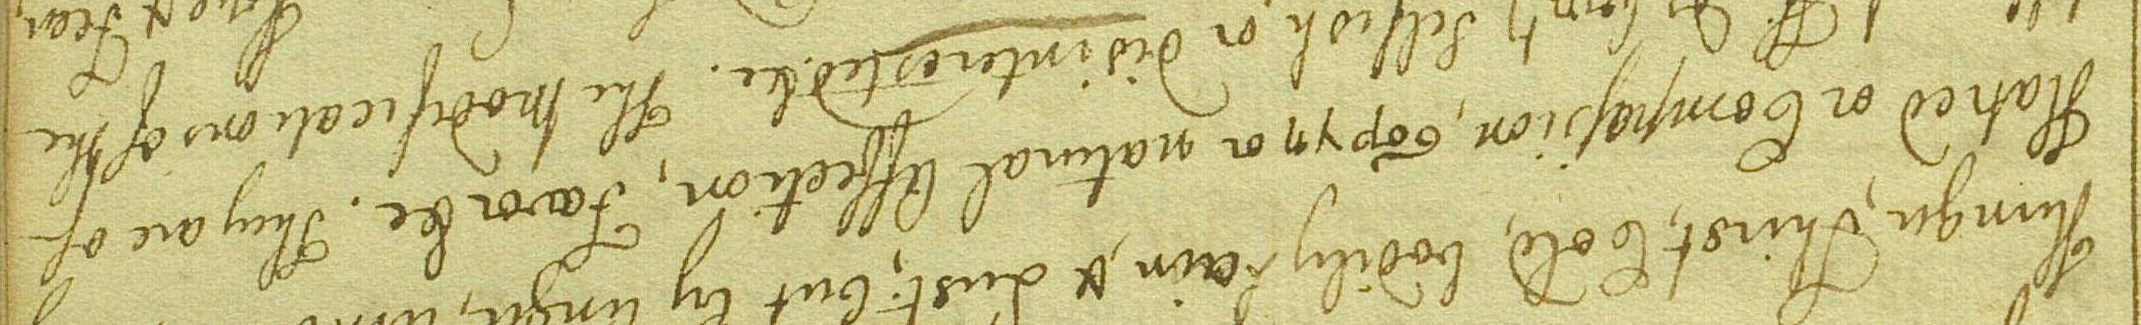Hatred or Compassion, [______] or natural Affection, Favor &c. They are of
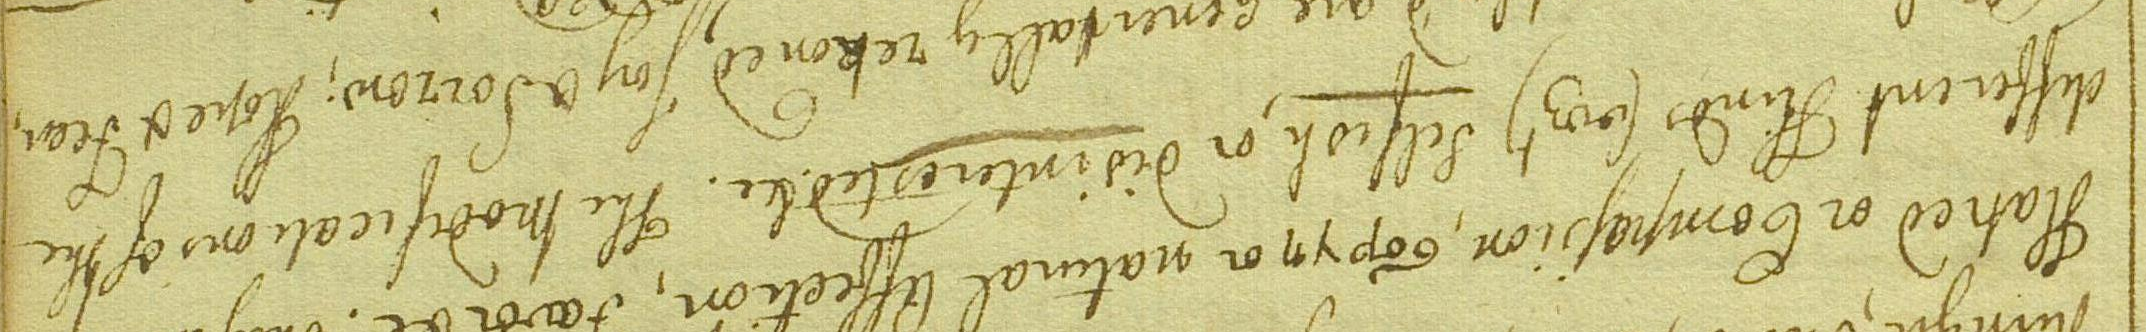different Kinds (viz^t) Selfish, or disinterested &c. The modifications of the
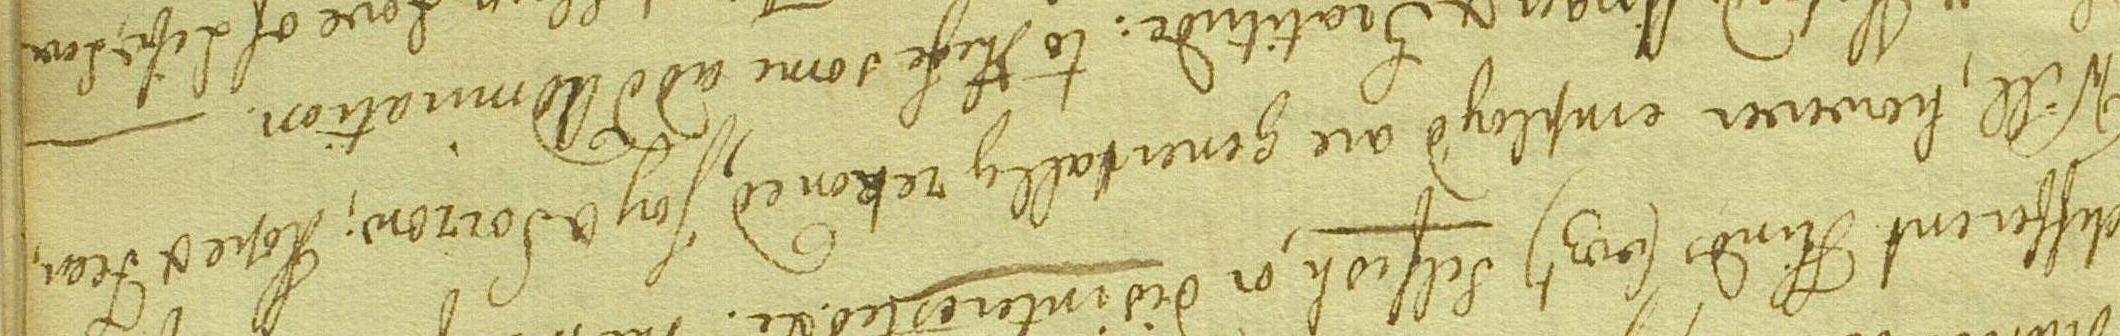Will, however employ'd are generally rekoned, Joy & Sorrow; Hope & Fear,
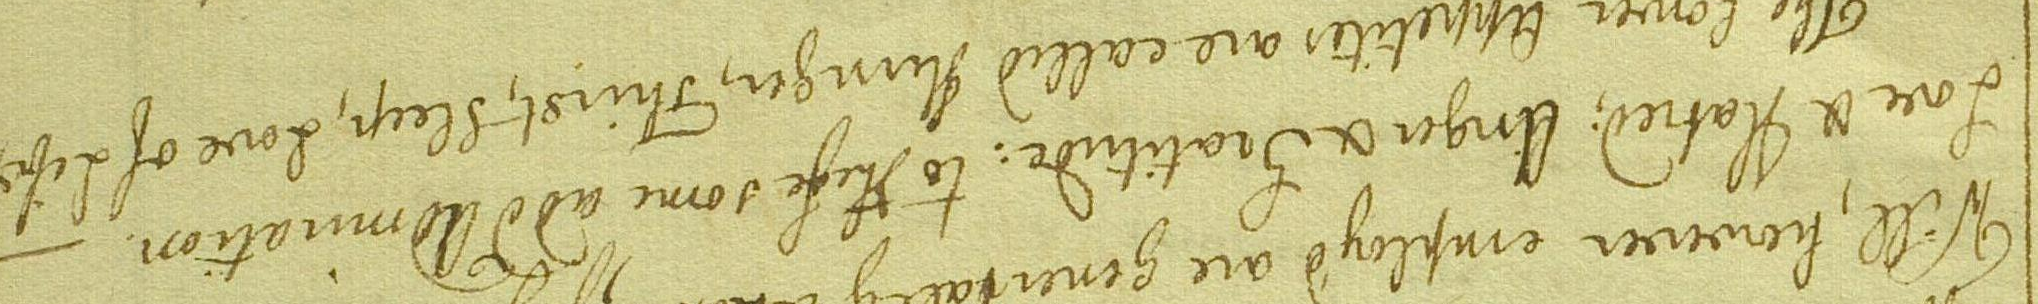Love & Hatred; Anger & Gratitude: to these some add Admiration.-
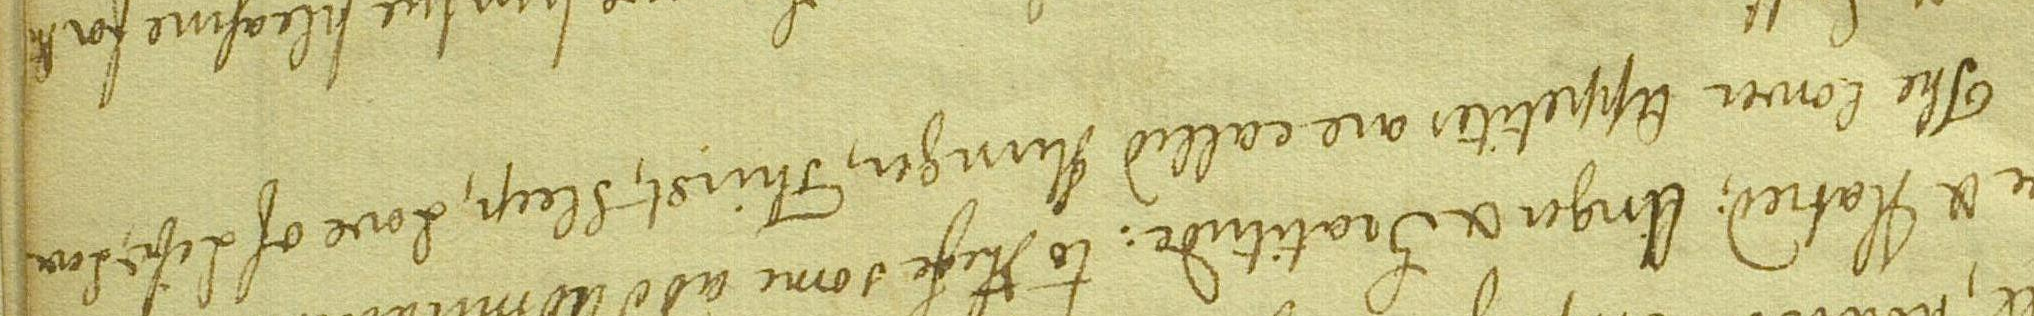The lower Appetites are called Hunger, Thirst, Sleep, Love of Life, Love
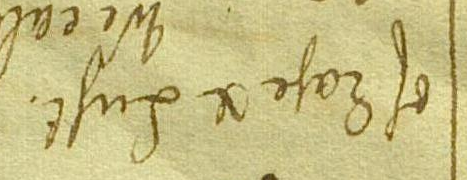of Ease & Lust.
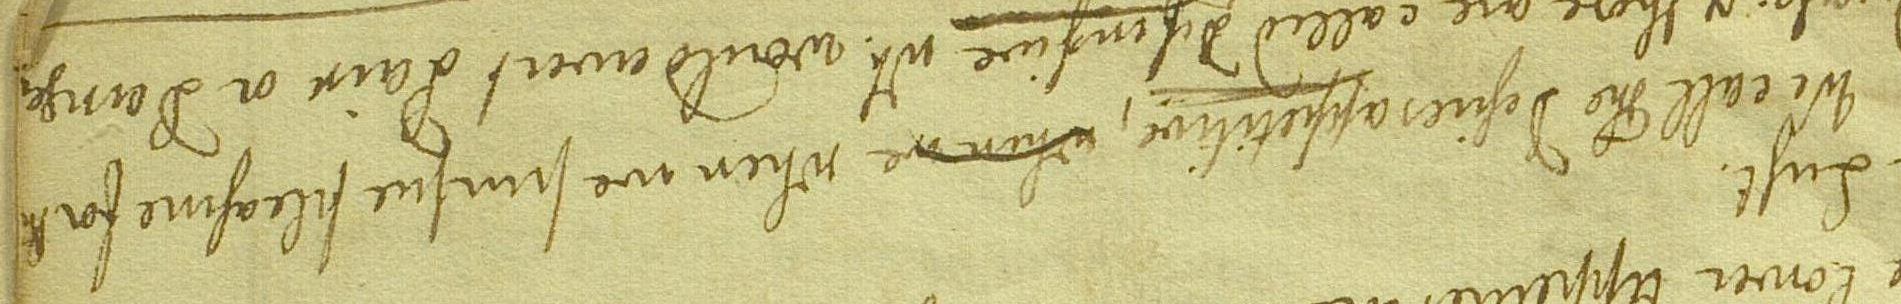We call the Desires appetitive, when we when we pursue pleasure for the
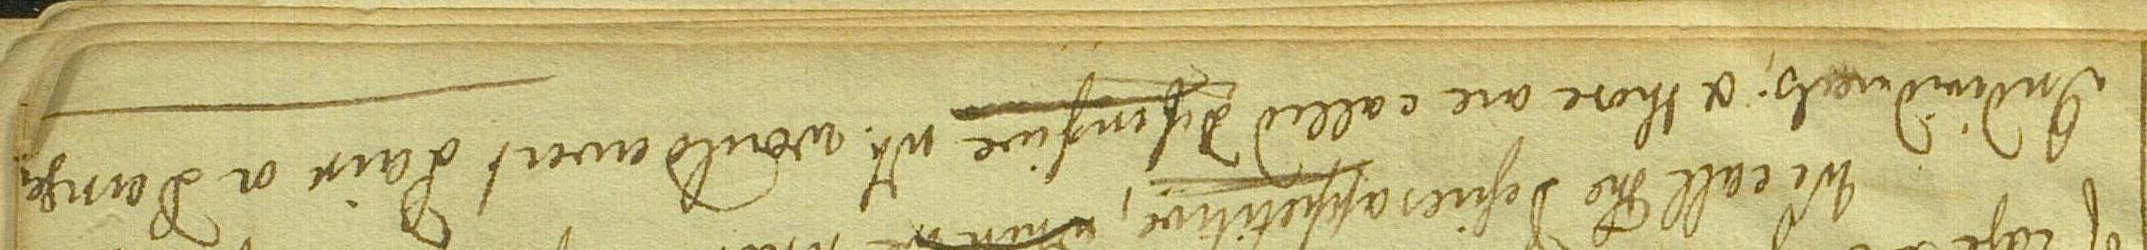Individuals; & those are called Defensive w^h. would avert Pain or Danger
